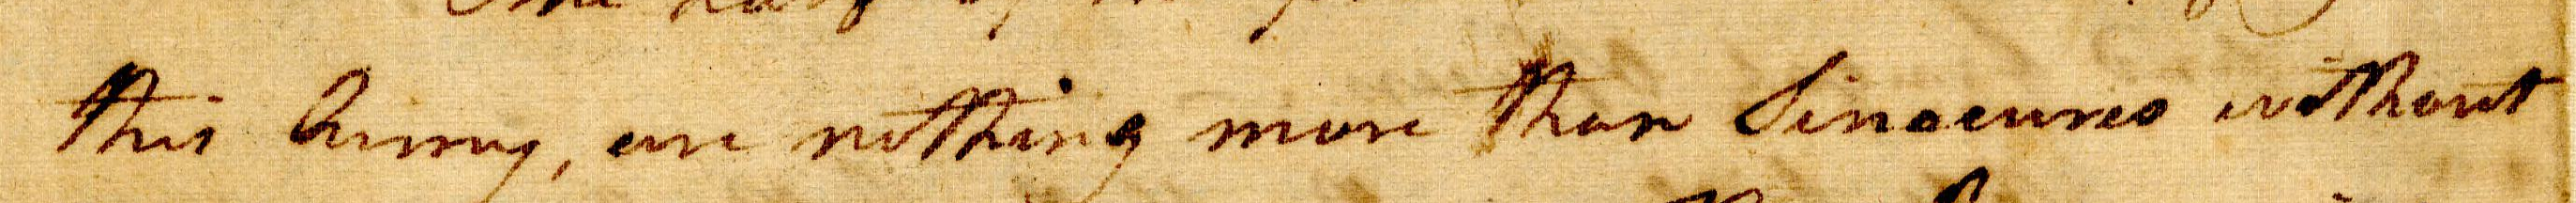this Army are noting more than Sinecures without
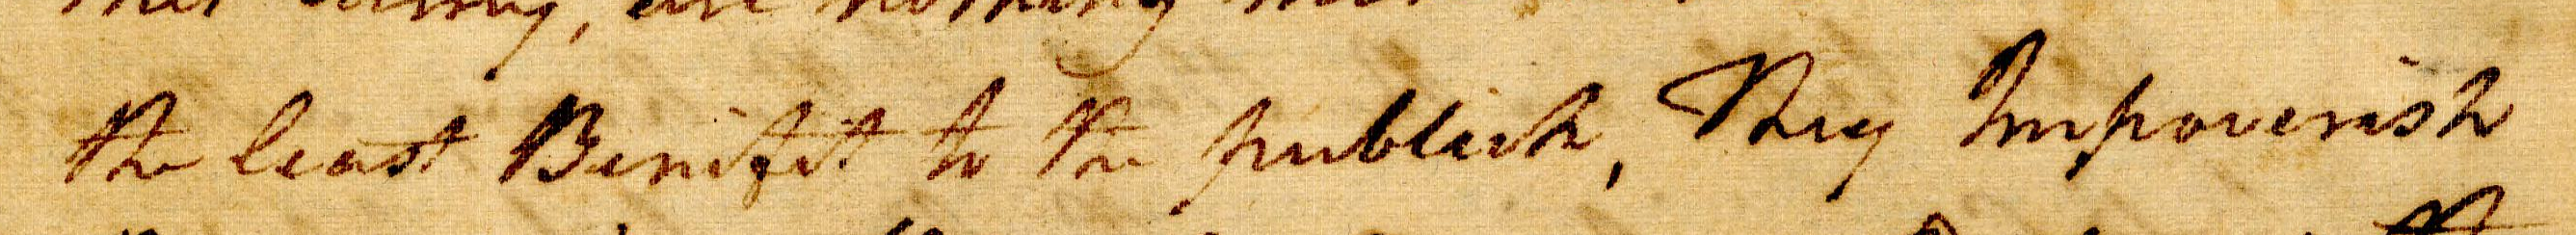the least Benifit to the publick, They Impoverish
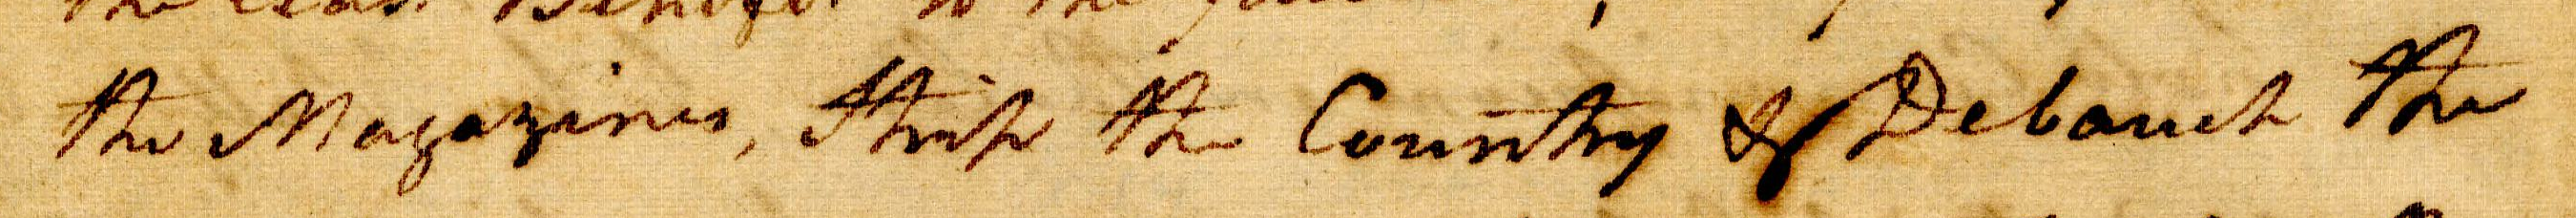the Magazines, Shift the Country & Debauch the
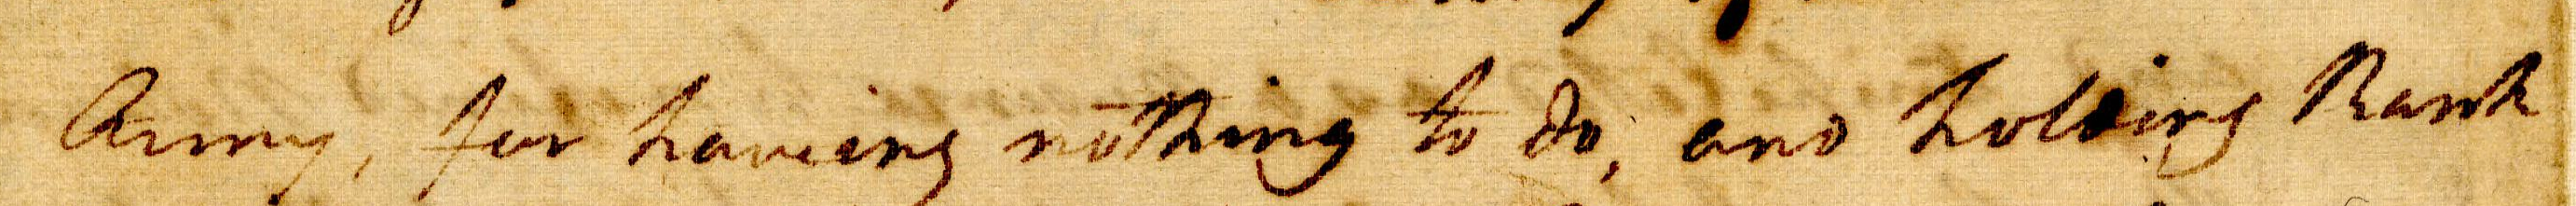Army, for haveing nothing to do, and holding Rank
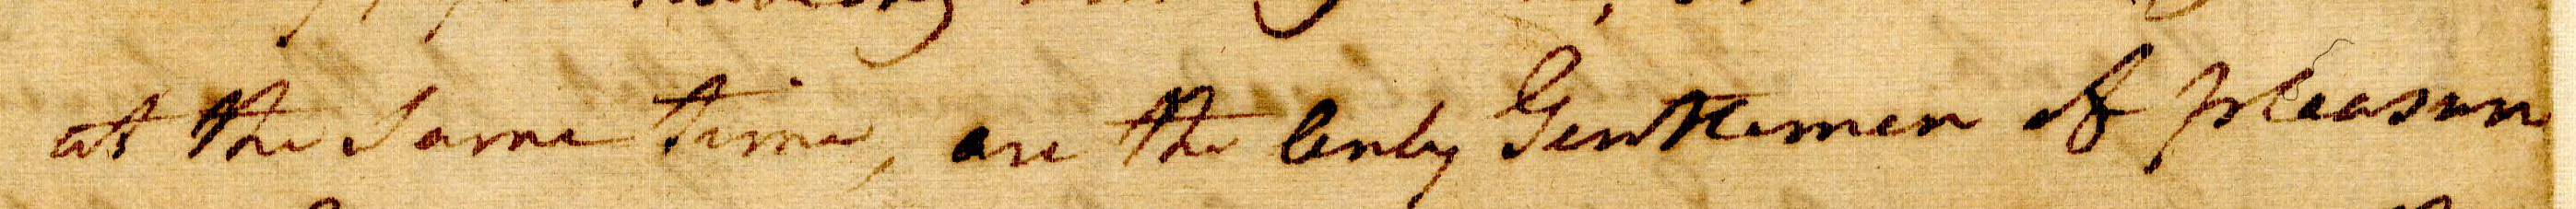at the same time, are the only Gentlemen of pleasur
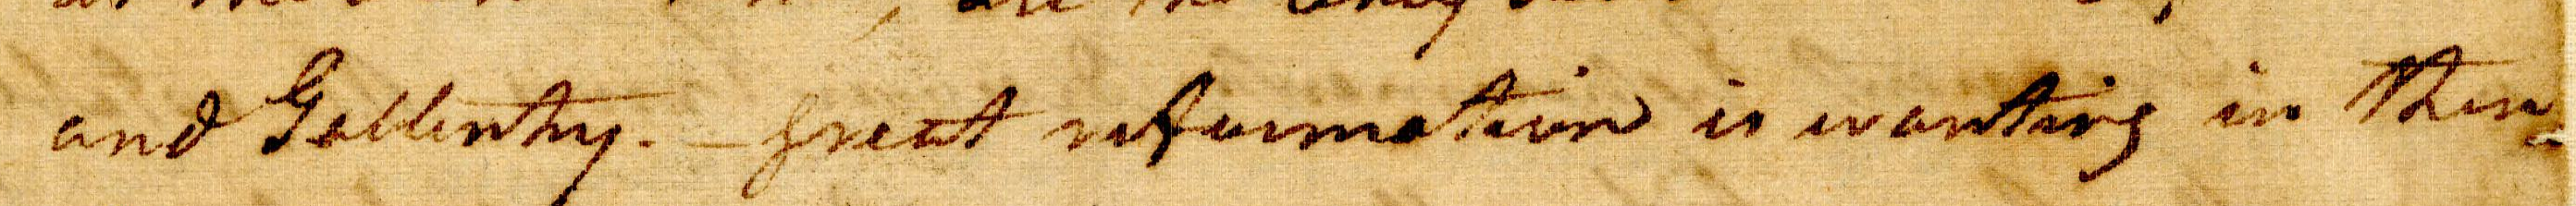and Gallentry.- great information is wanting in these
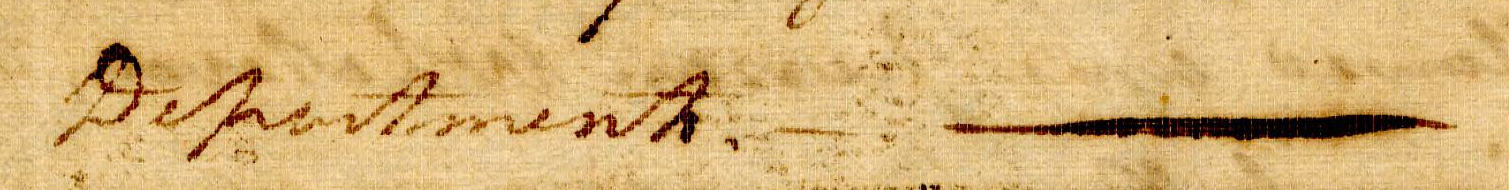Departments.-
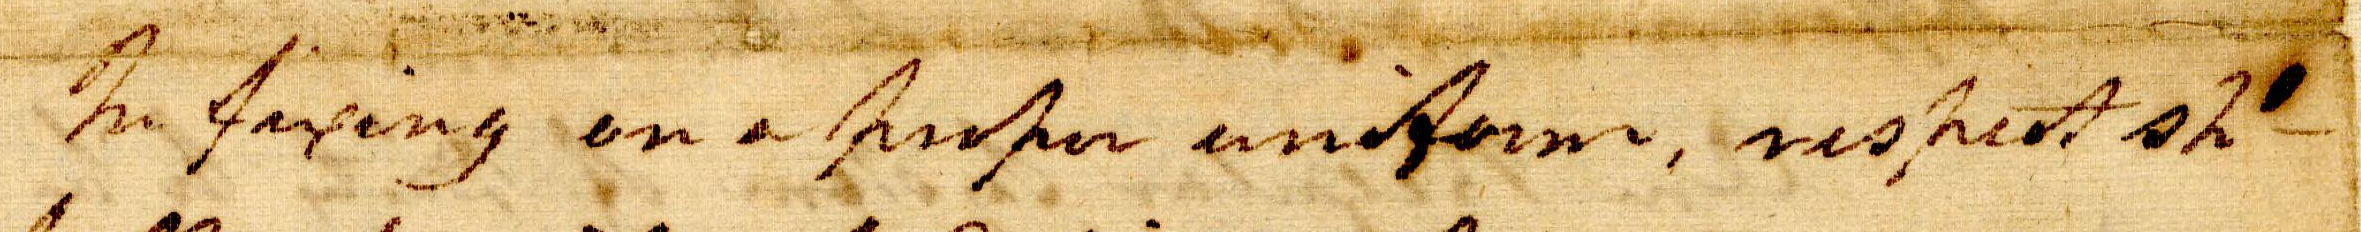In fixing on a proper uniform, respect sh-
